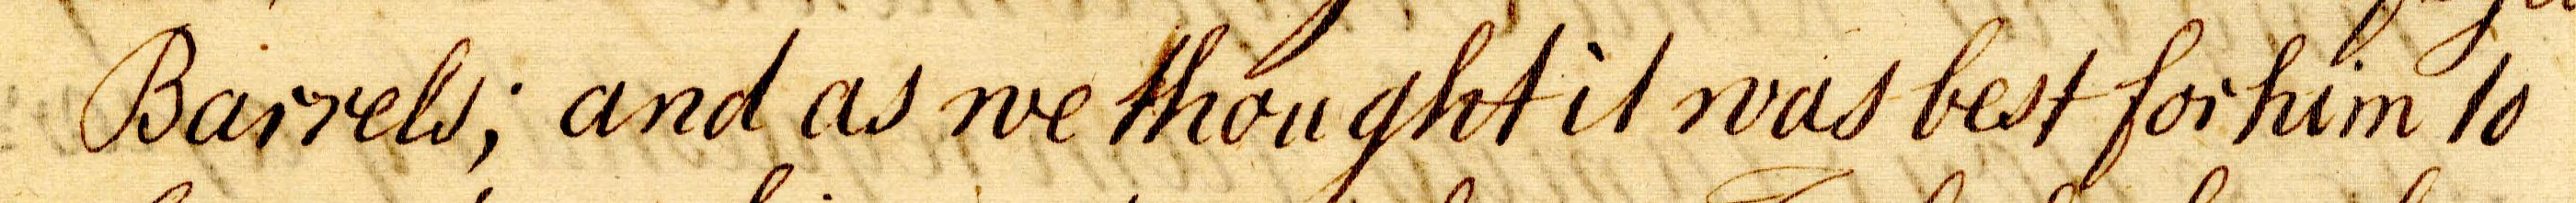Barrels; and as we thought it was best for him to
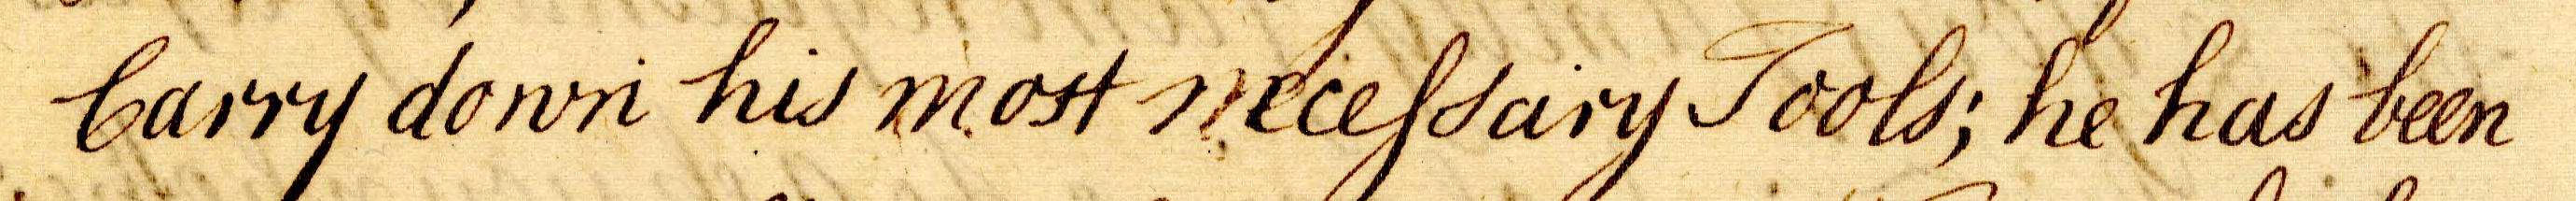Carry down his most necessary Tools; he has been
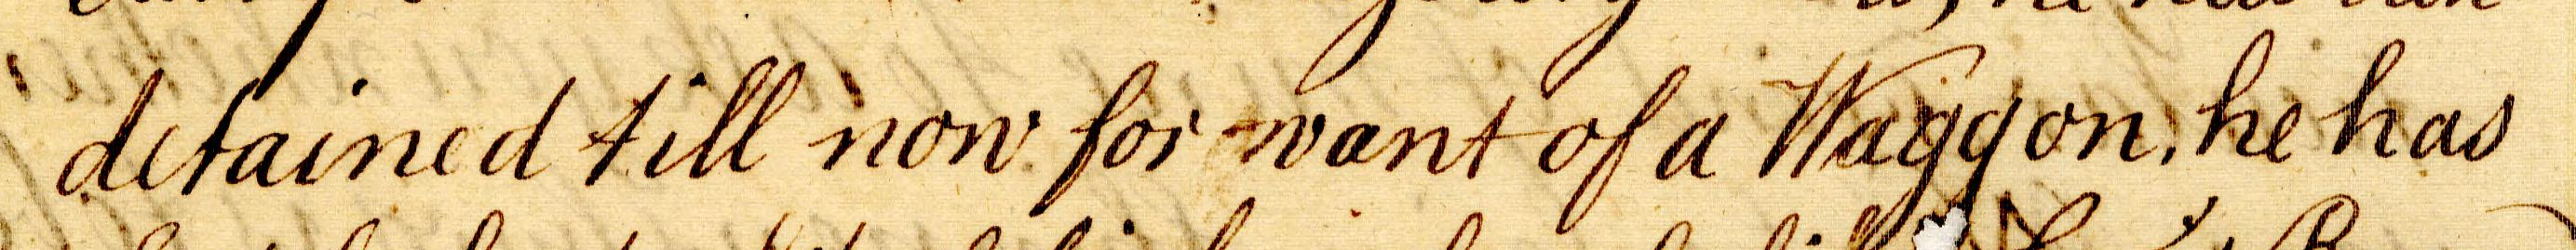detained till now for want of a Waggon, he has
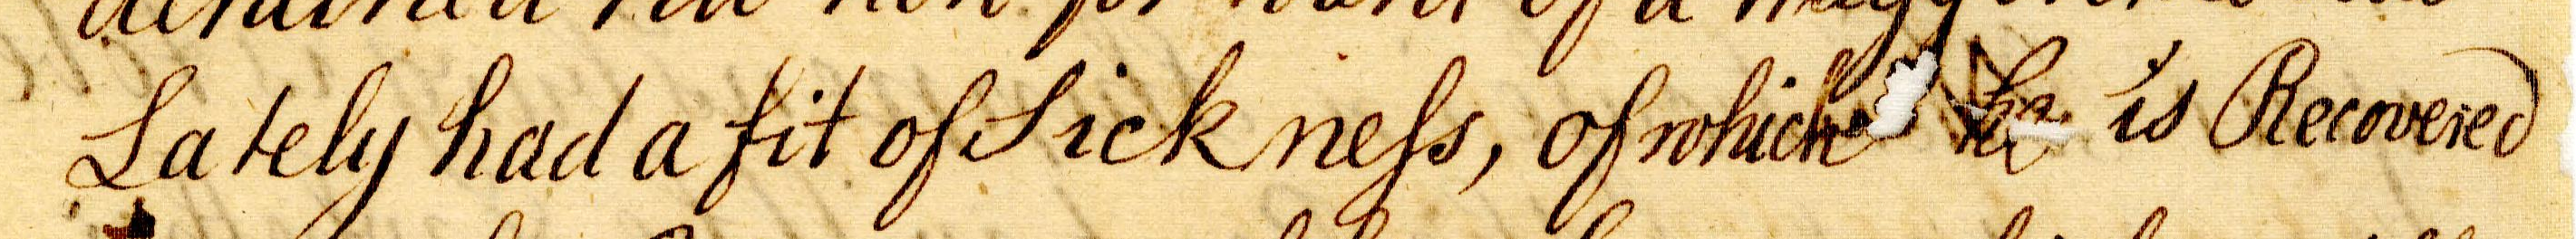Lately had a fit of Sickness, of which he is Recovered
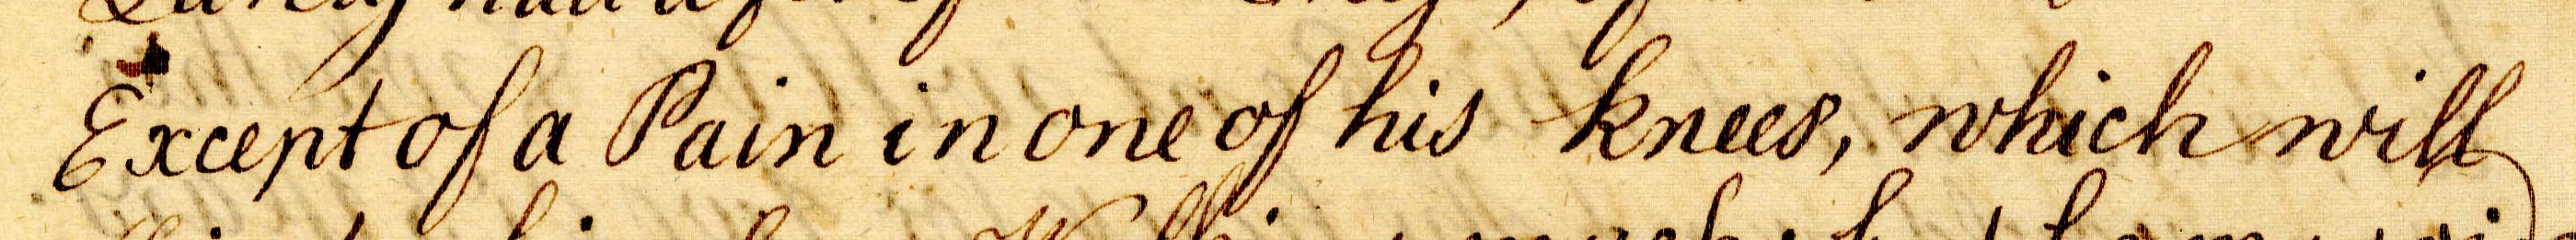Except of a Pain in one of his knees, which will
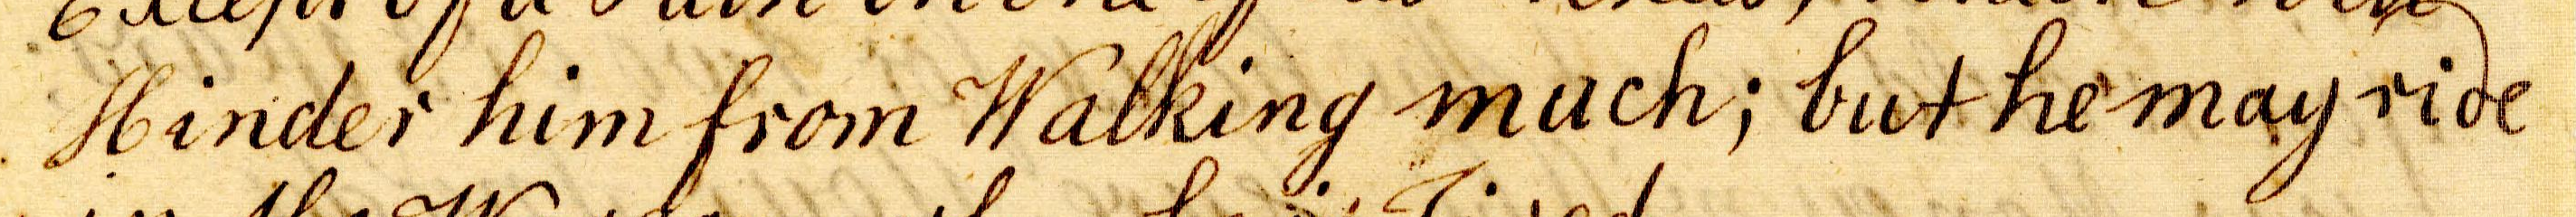Hinder him from Walking much; but he may ride
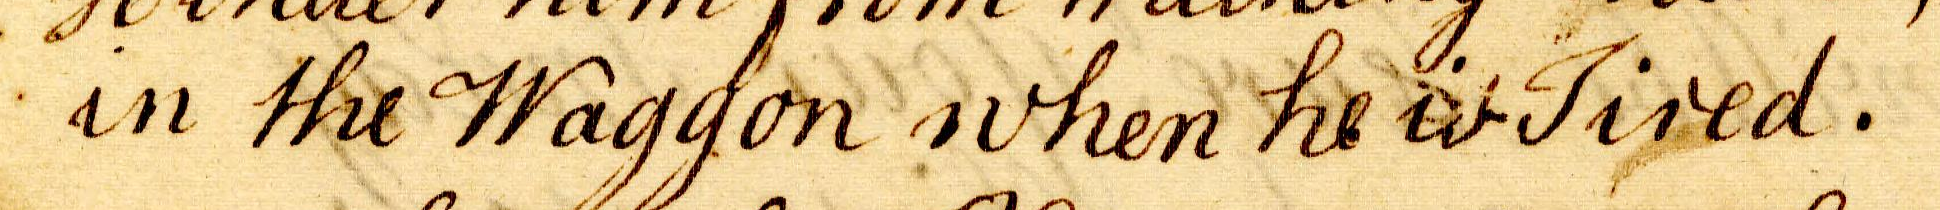in the Waggon when he is Tired.
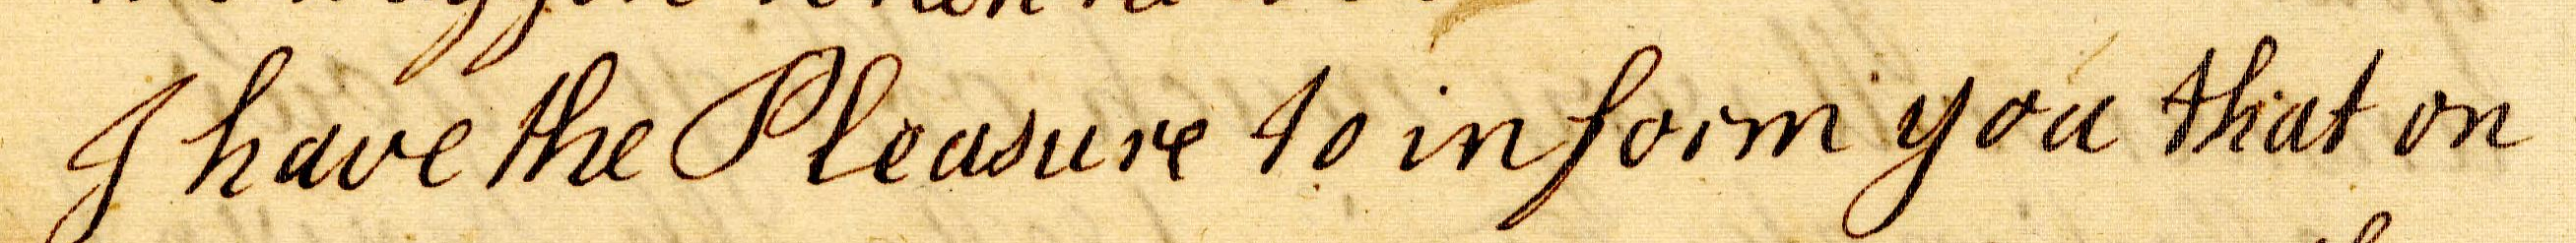If have the Pleasure to inform you that on
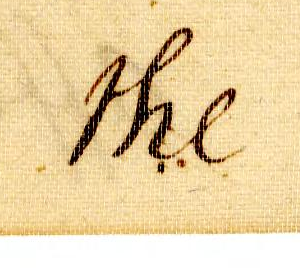the
